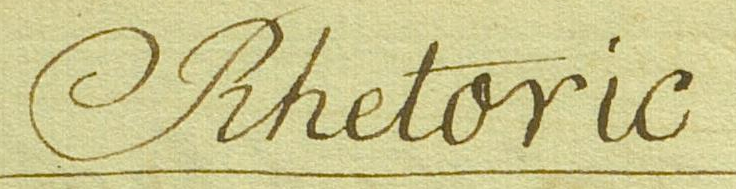Rhetoric
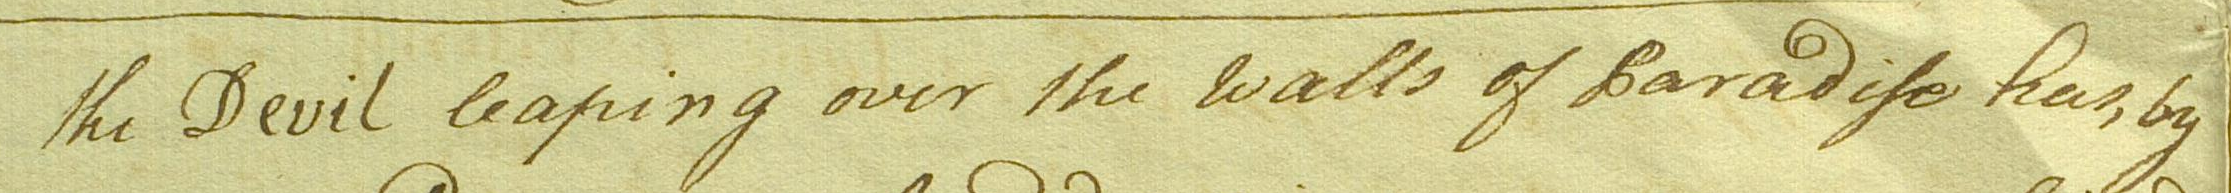the Devil leaping over the walls of Paradise has, by
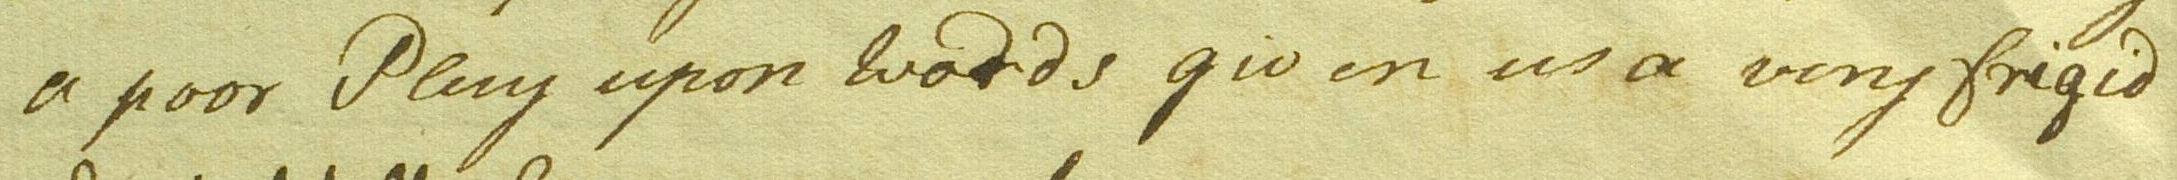a poor Play upon words given us a very frigid
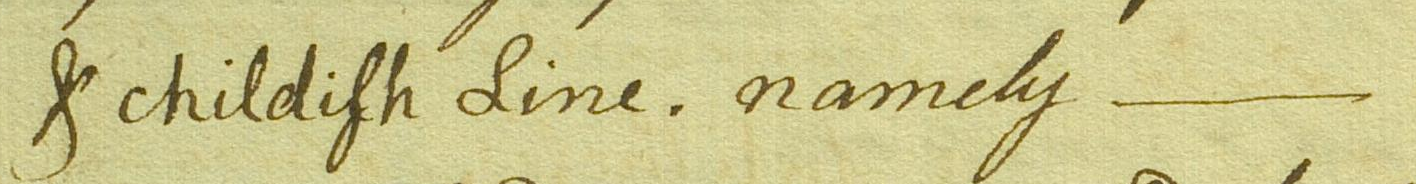& childish Line. namely-
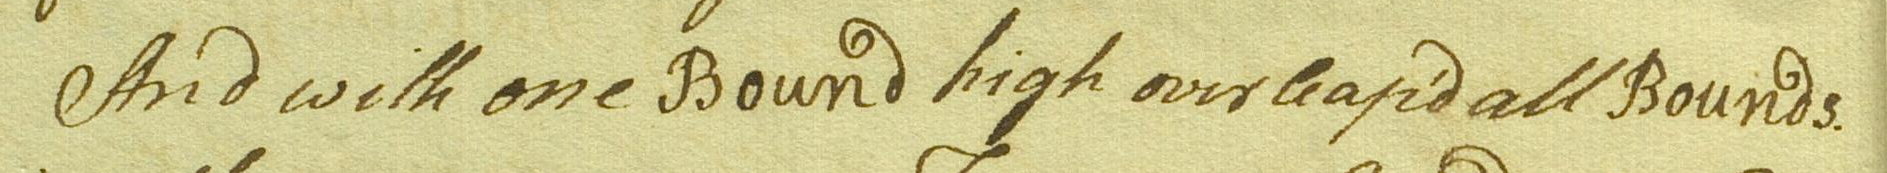And with one Bound high overleap'd all Bounds.
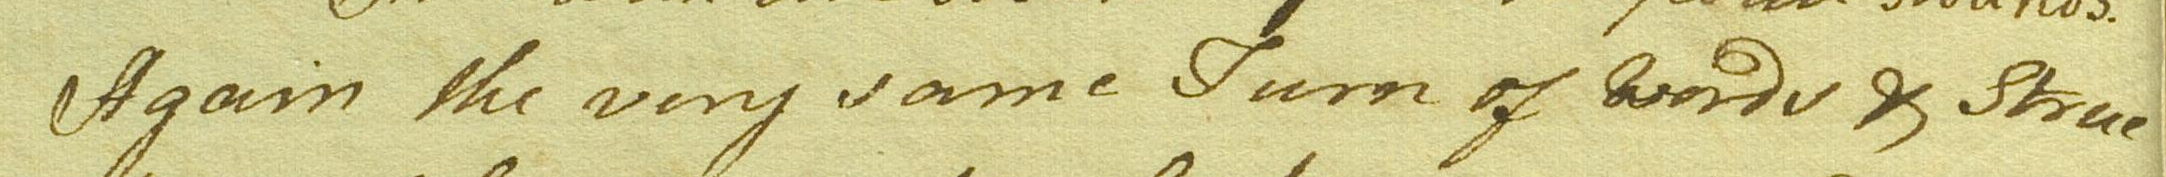Again the very same Turn of Words & Struc
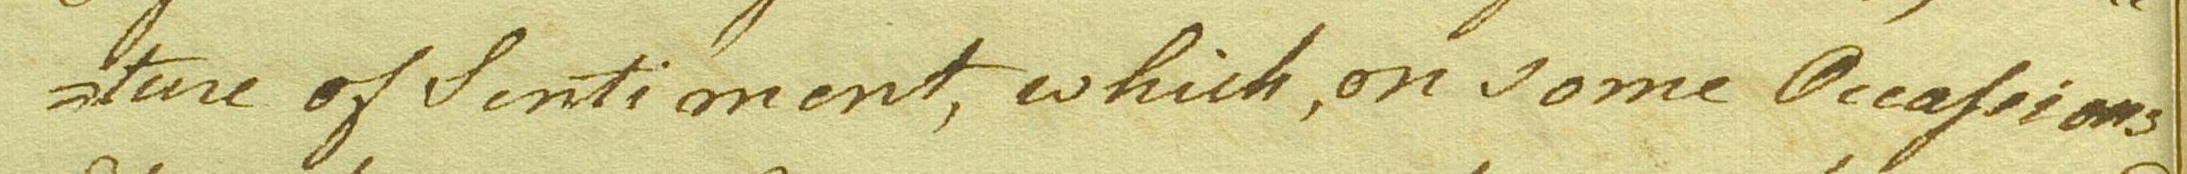-ture of Sentiment, which, on some Occasions
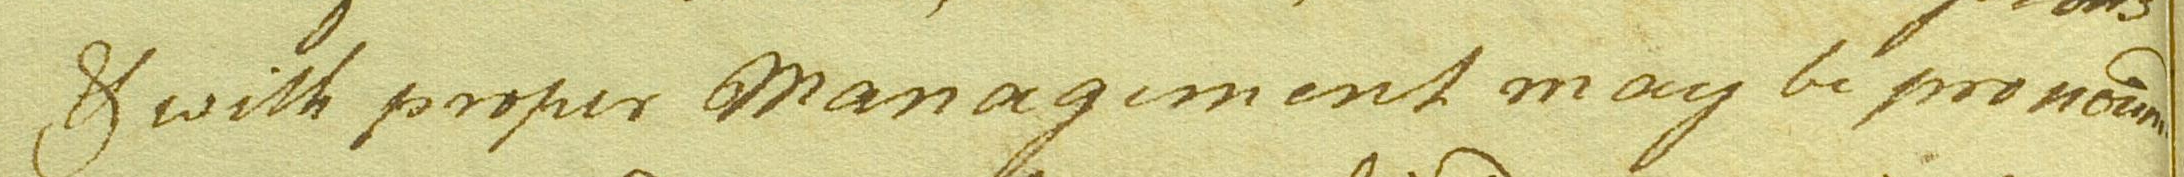& with proper Management may be pronounced
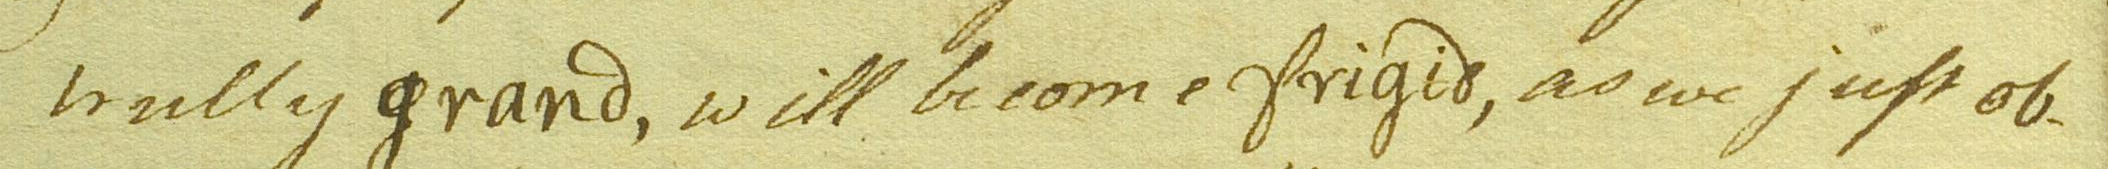truly grand, will become frigid, as we just ob-
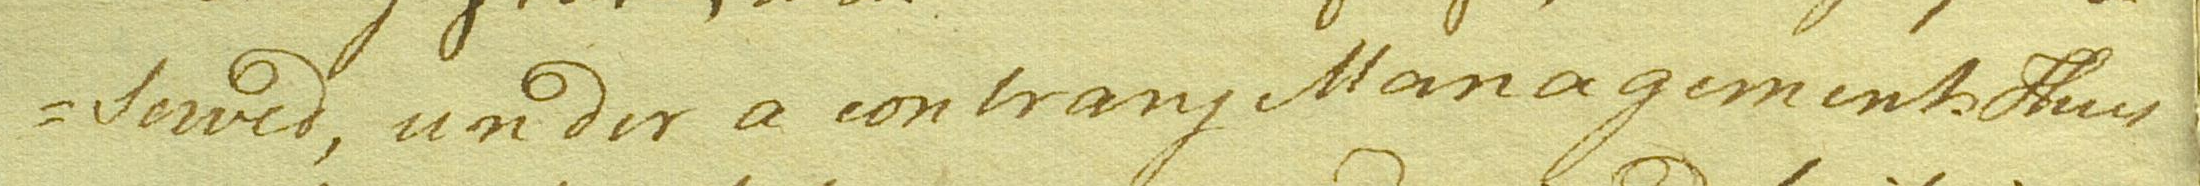-served, under a contrary Management. Thus
